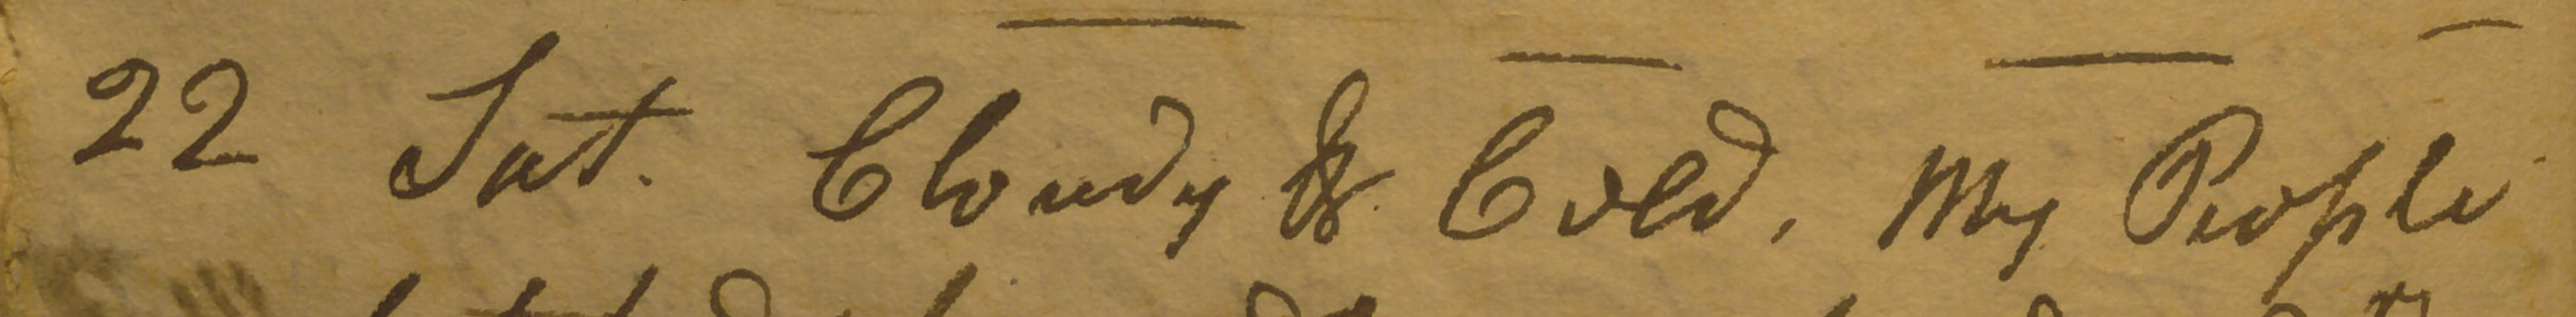22 Sat. Cloudy & Cold, My People
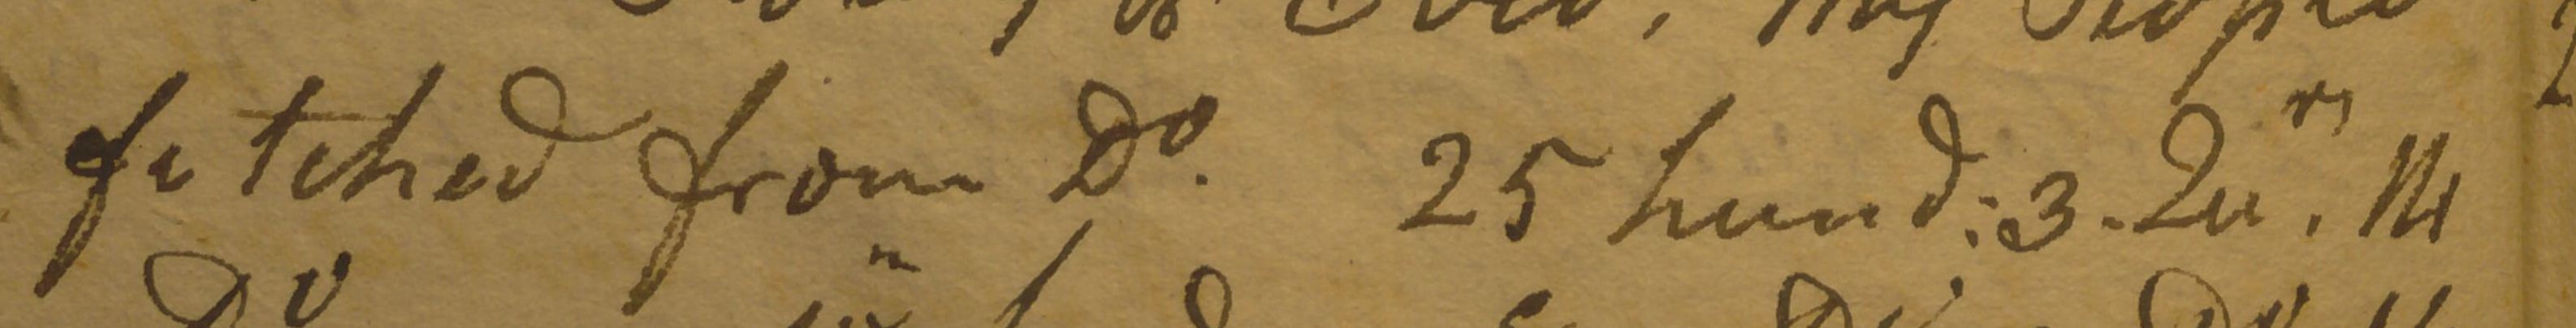fetched from D^o. 25 hund: 3. Qu^rs. 14
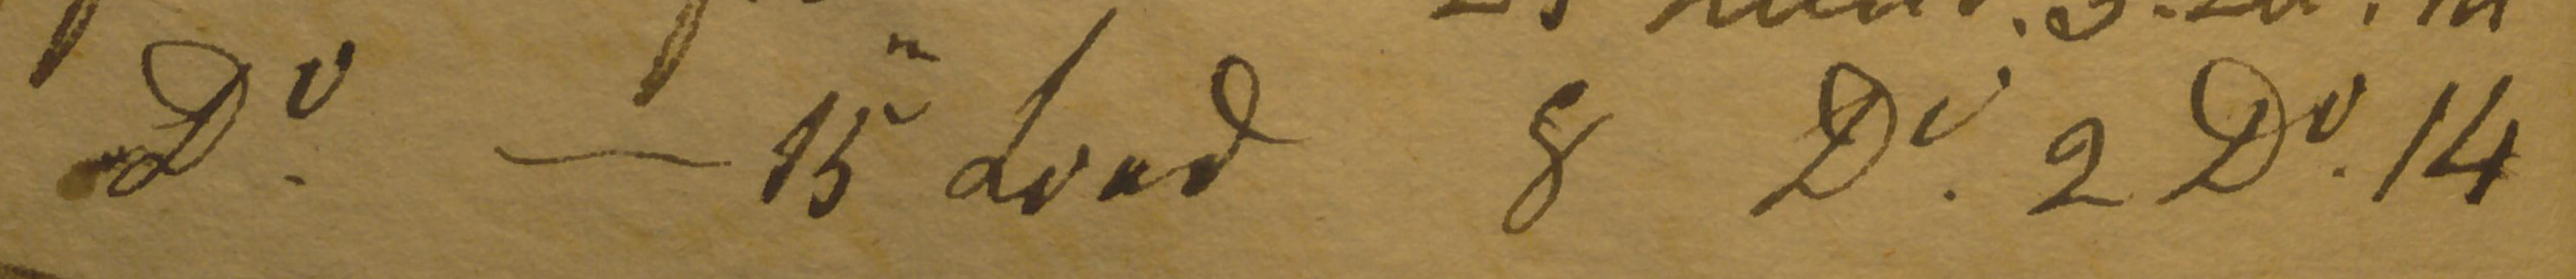D^o.- 15^th Load 8 D^o. 2 D^o. 14
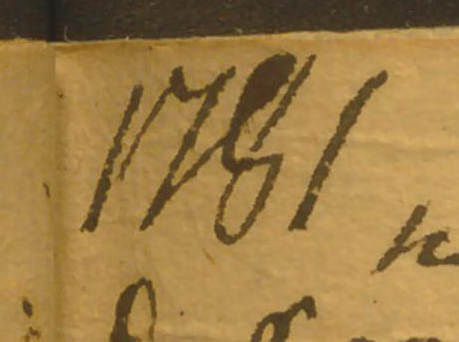1781
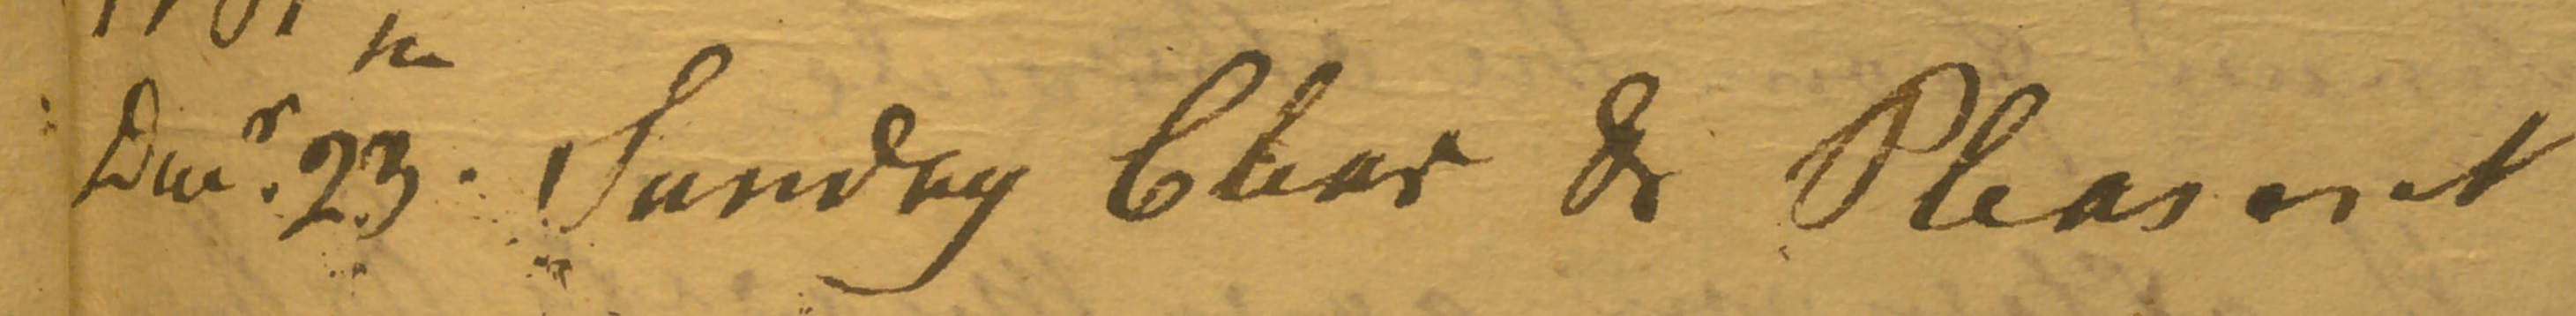Dec^r. 23^th. Sunday Clear & Pleaseret
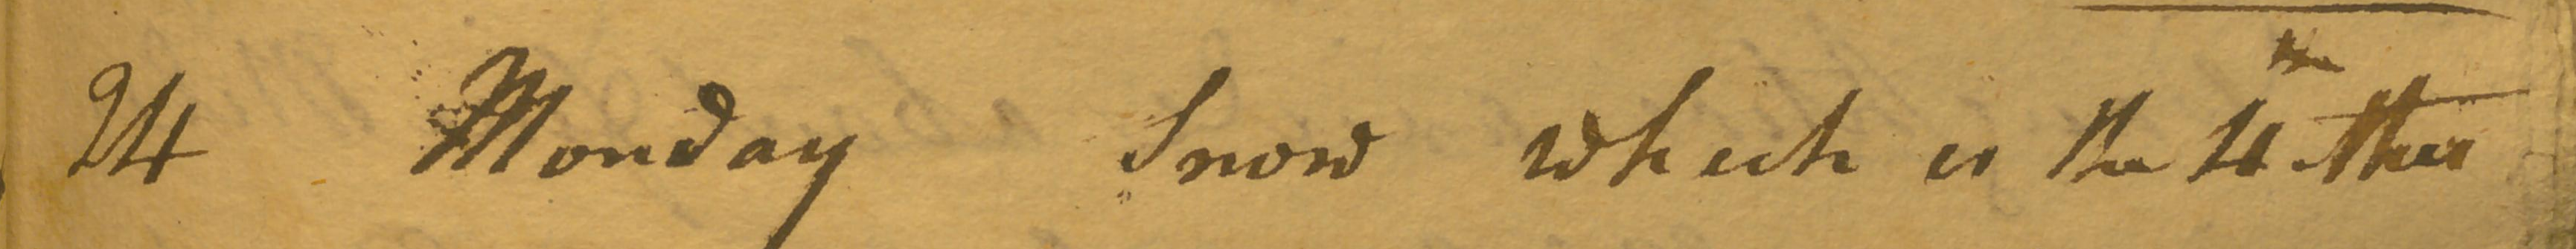24 Monday Snow which is the 4^th this
